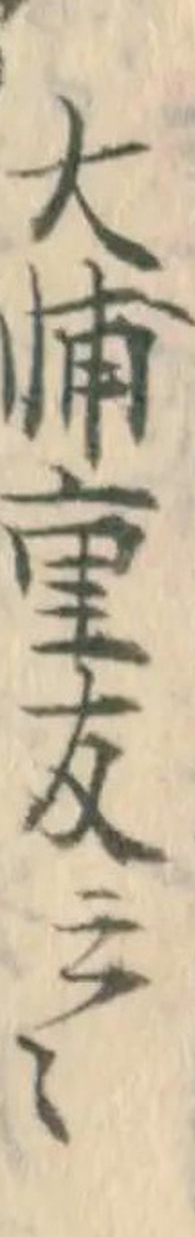大輔重友云々
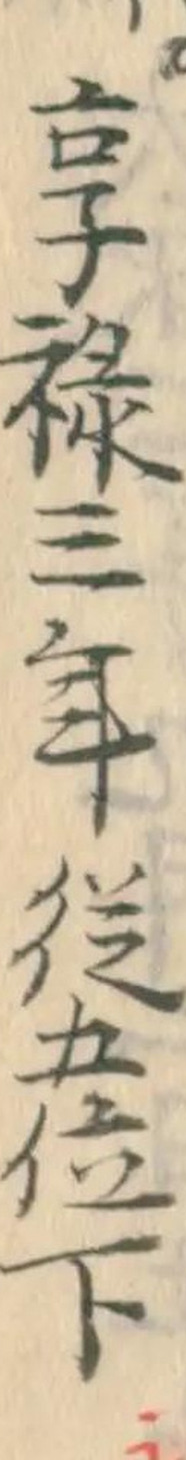享禄三年従五位下

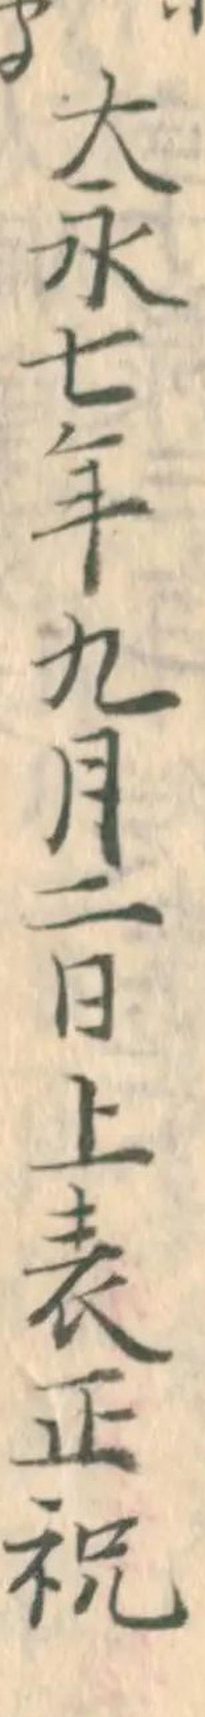重能大永七年九月二日上表正祝
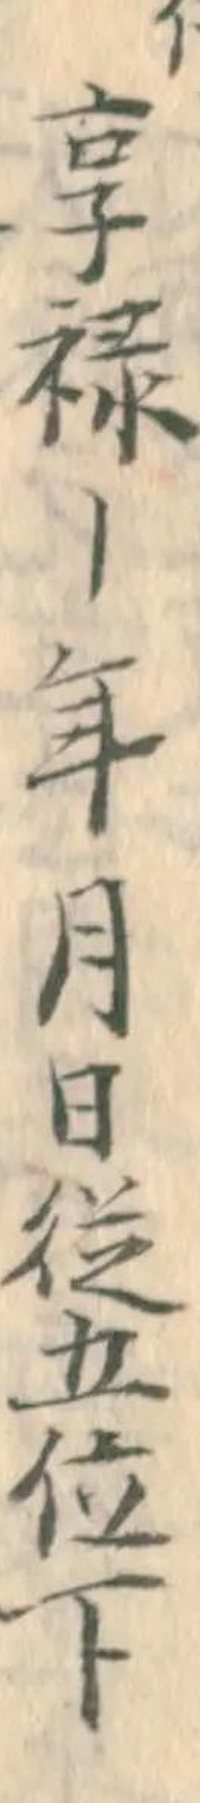享禄―年月日従五位下
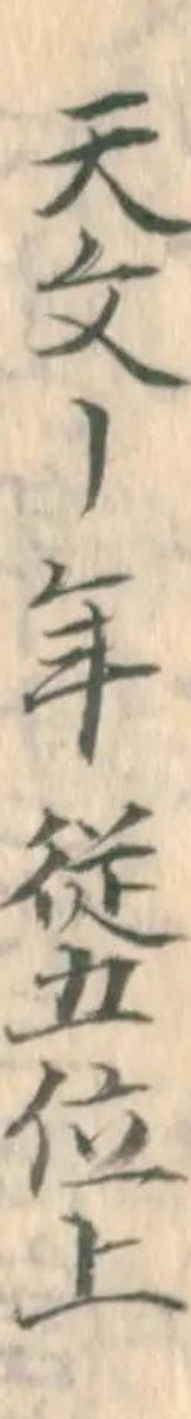天文―年従五位上
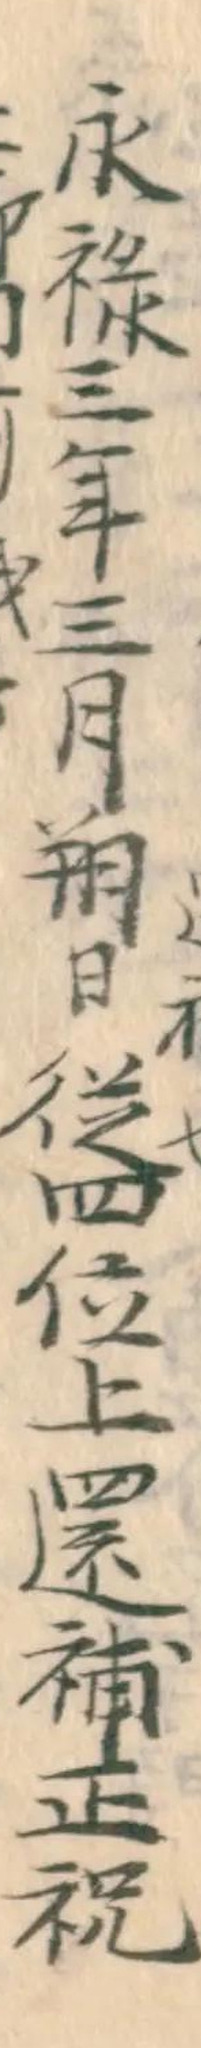永禄三年三月朔日従四位上還補正祝
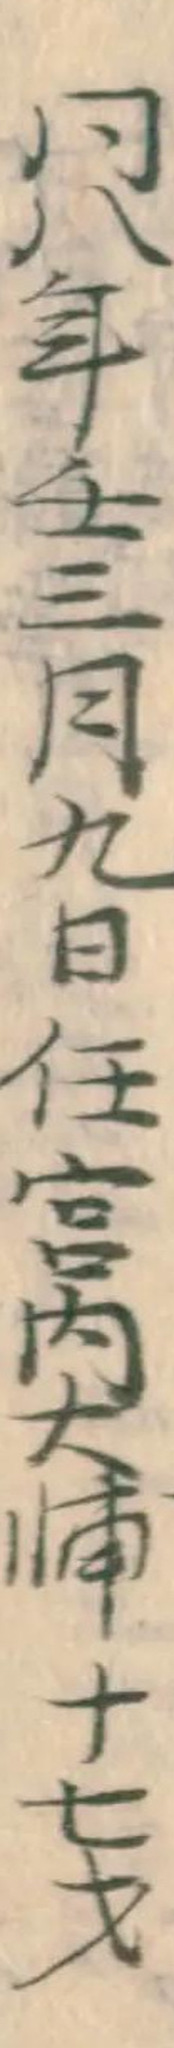同八年壬三月九日任宮内大輔十七才
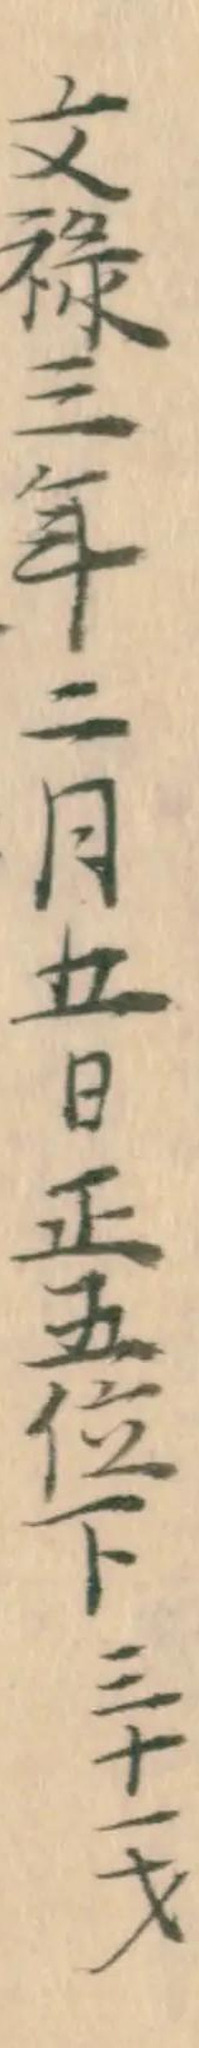文禄三年二月五日正五位下三十一才
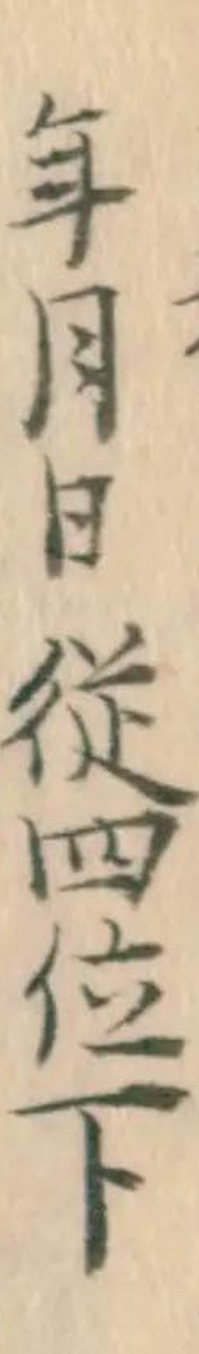年月日従四位下
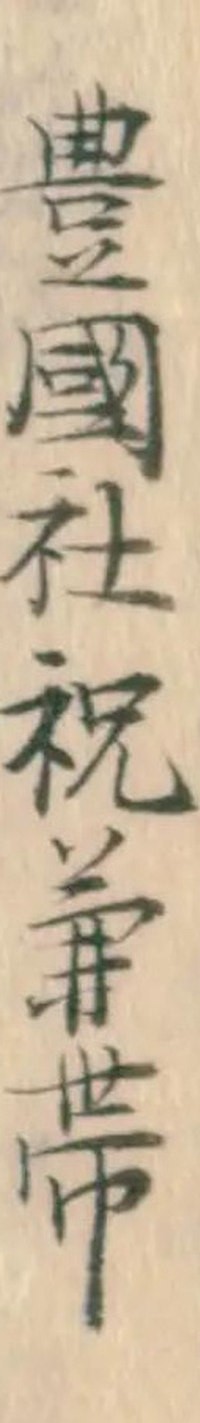豊国社祝兼帯
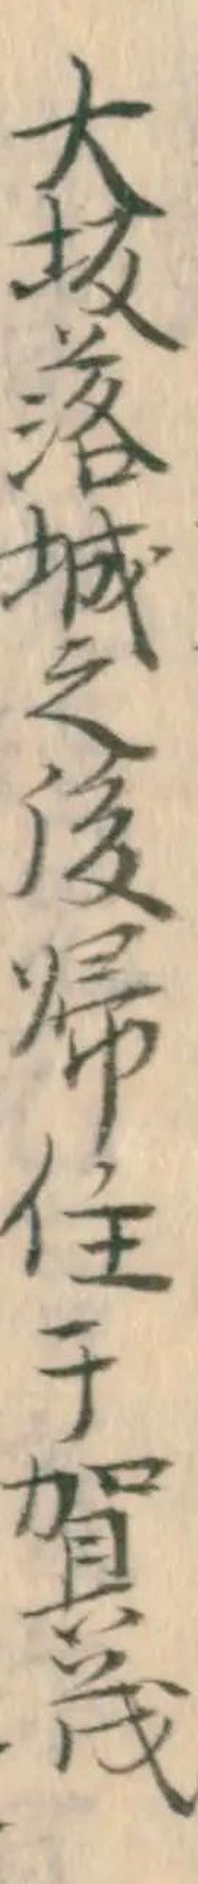大坂落城之後帰住于賀茂
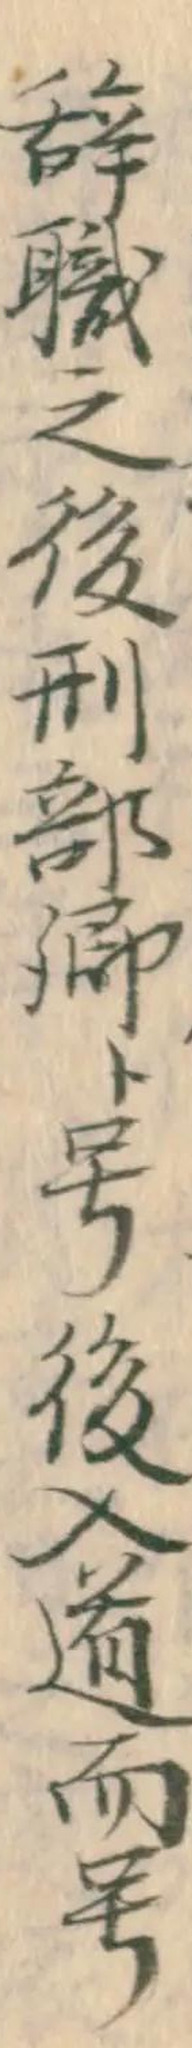辞職之後刑部卿ト号後入道而号
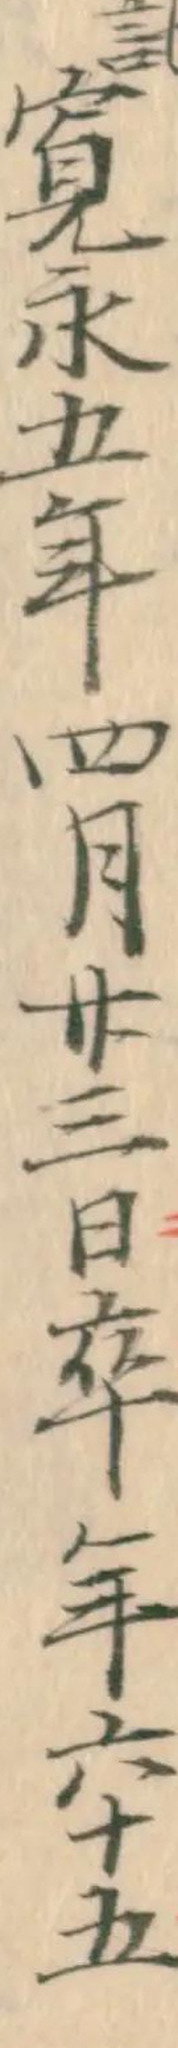寛永五年四月廿三日卒年六十五
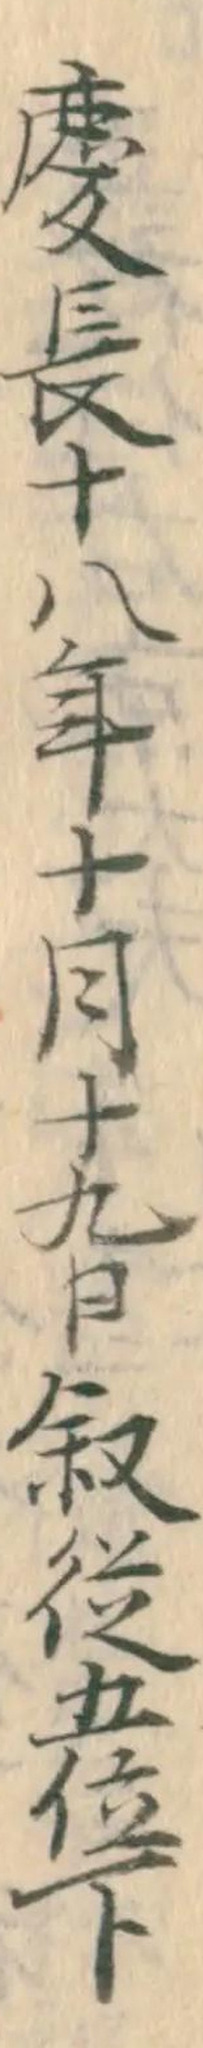重次慶長十八年十月十九日叙従五位下

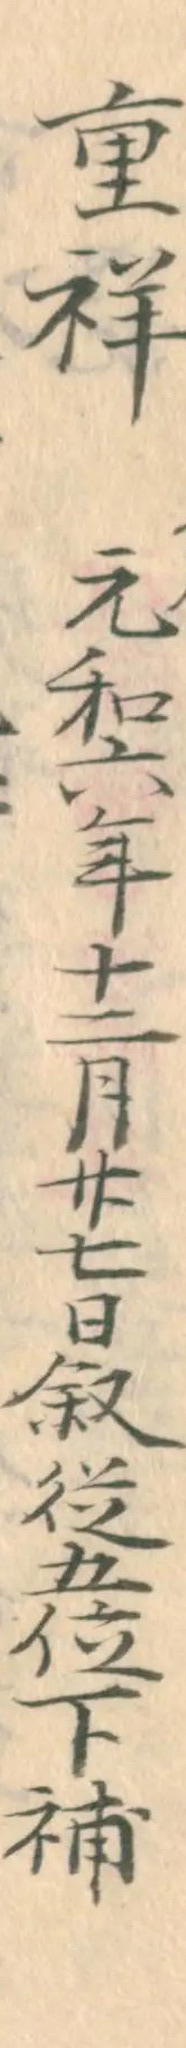重祥元和六年十二月廿七日叙従五位下補
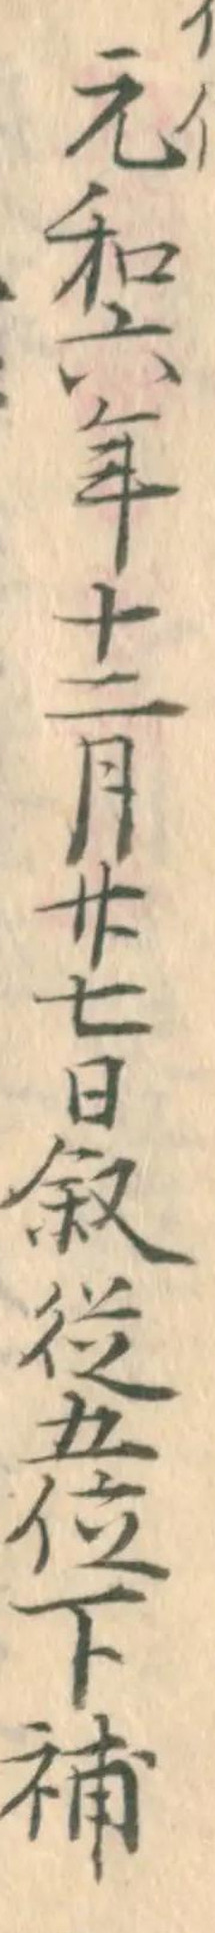重祥元和六年十二月廿七日叙従五位下補
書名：賀茂社記録. 第23冊
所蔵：国立国会図書館 National Diet Library, JAPAN
